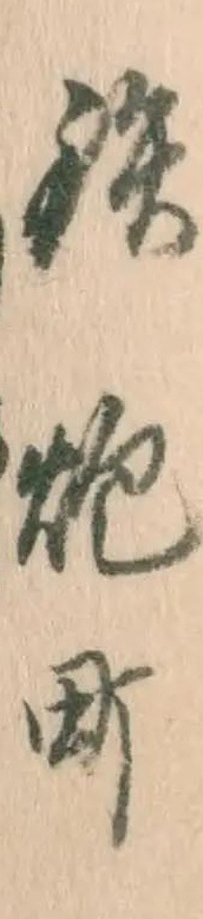鉄炮町
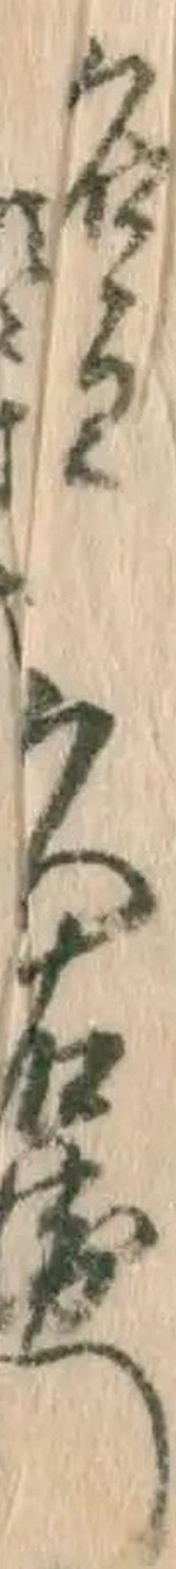名主久右衛門
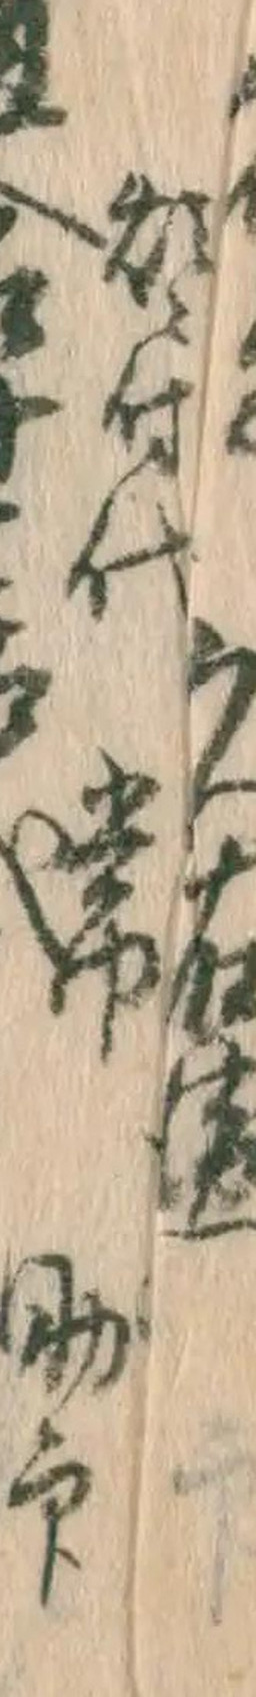煩ニ付代常助印
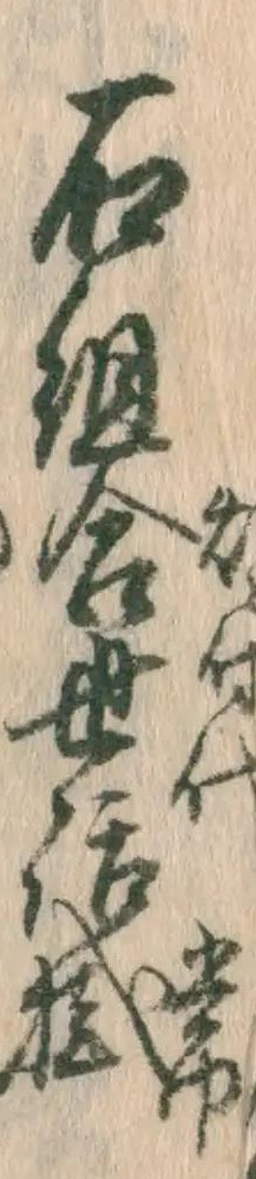右組合世話掛
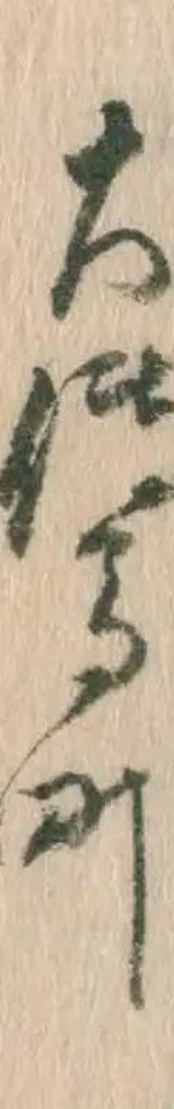大伝馬町
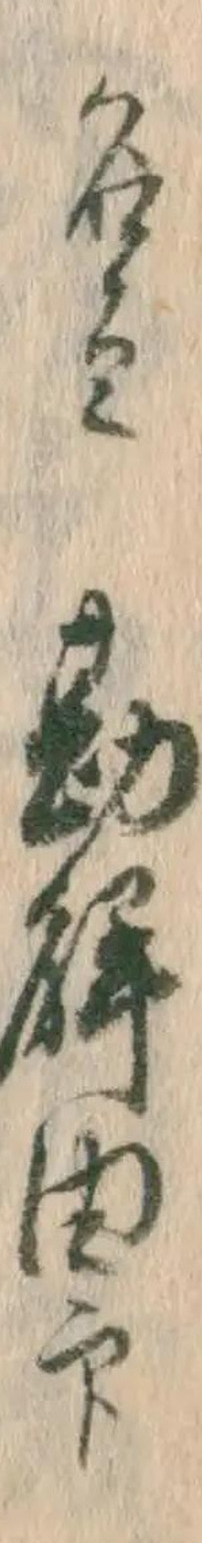名主勘解由印
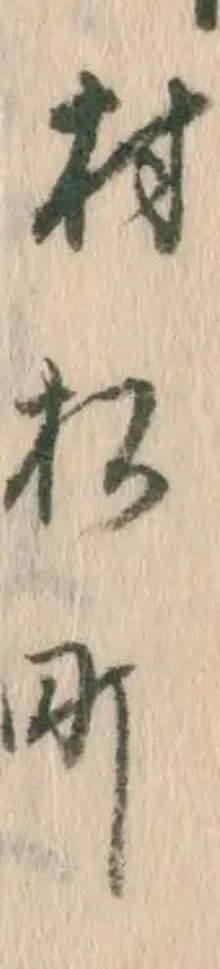村松町
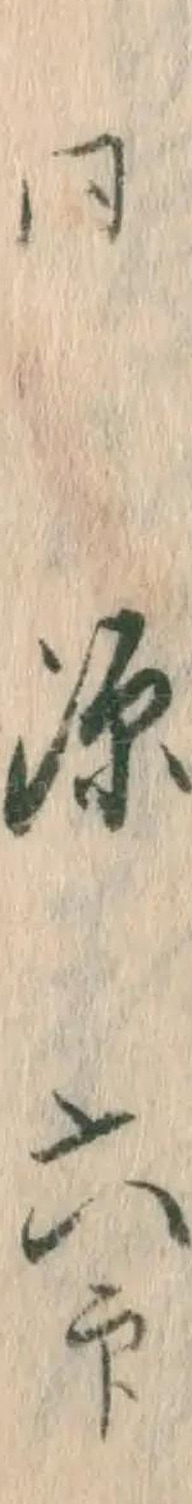同源六印
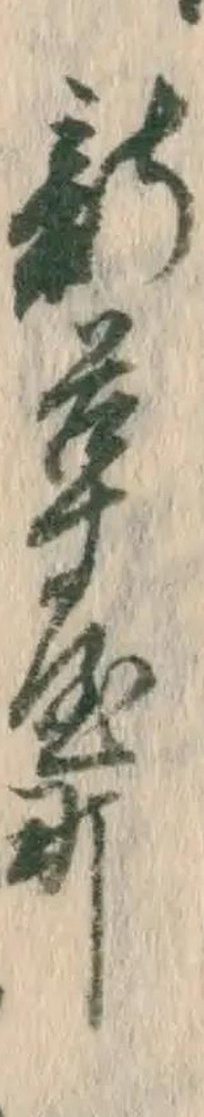新葺屋町
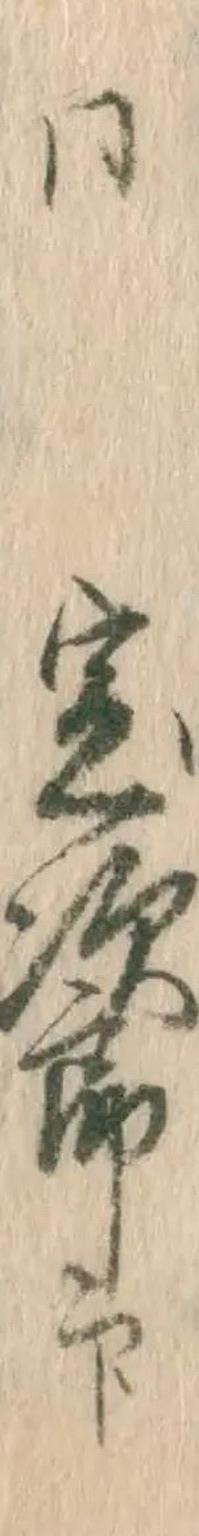同定次郎印
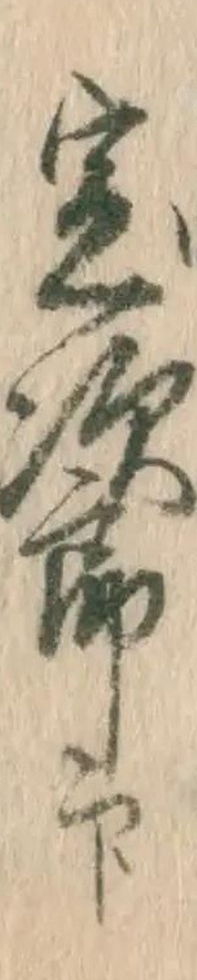同定次郎印

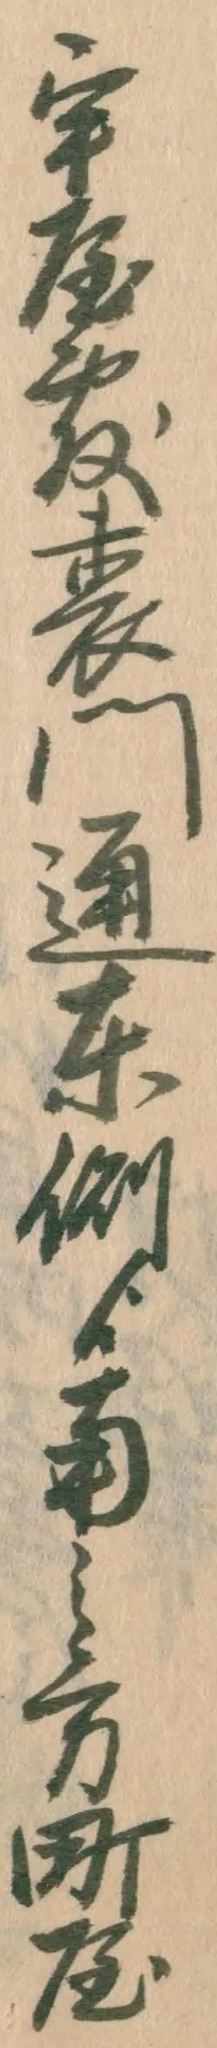牢屋敷裏門通東側ゟ南之方町屋
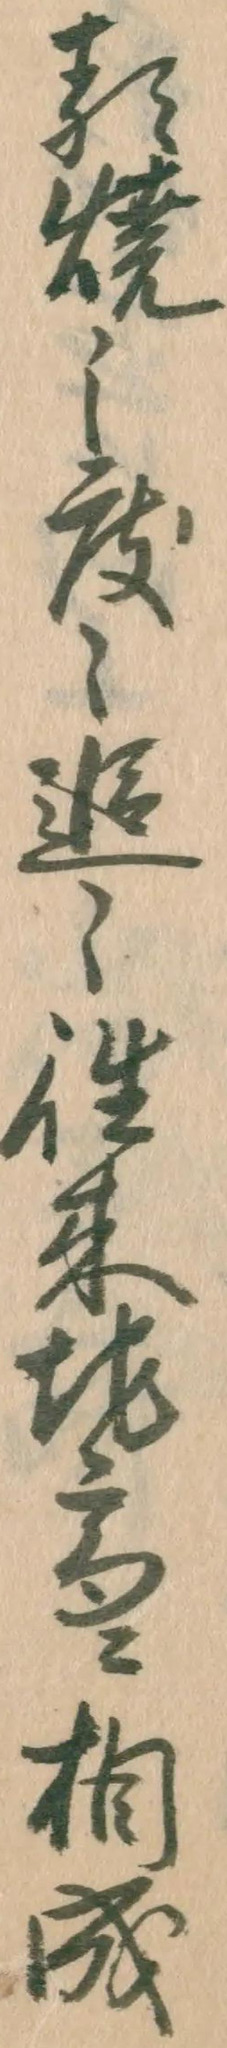類焼之度〻追〻往来地高ニ相成
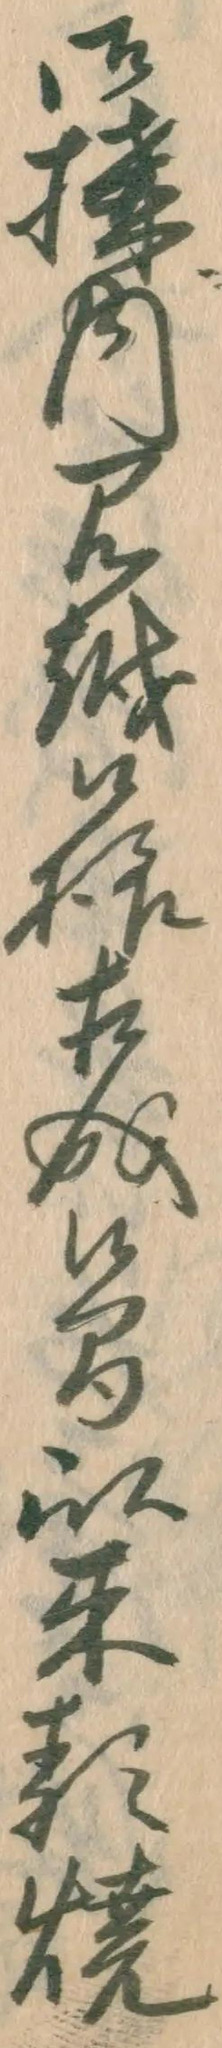御構内見越候様相成候間以来類焼
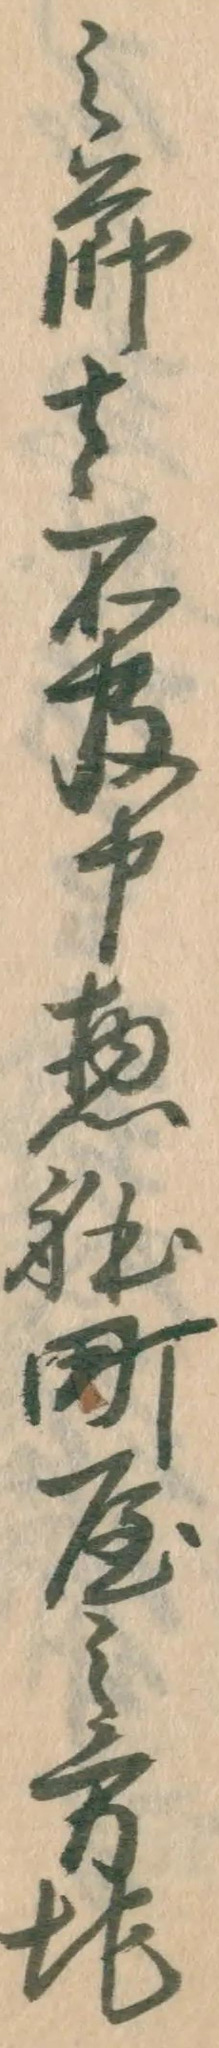之節は不及申惣体町屋之方地
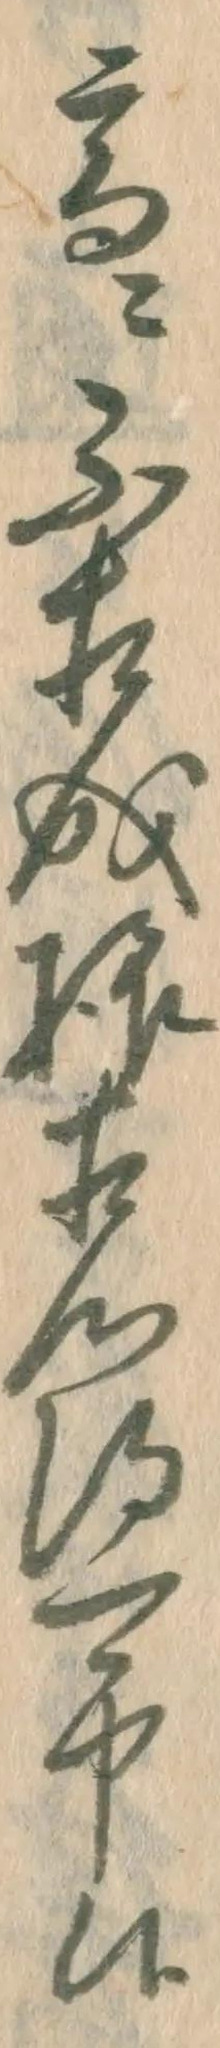高ニ不相成様相心得可申候
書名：七十冊物類集 71巻. [44] 四十三 牢屋敷御普請御修覆地震ニ付骨折候牢屋掛御褒美之部
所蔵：国立国会図書館 National Diet Library, JAPAN
